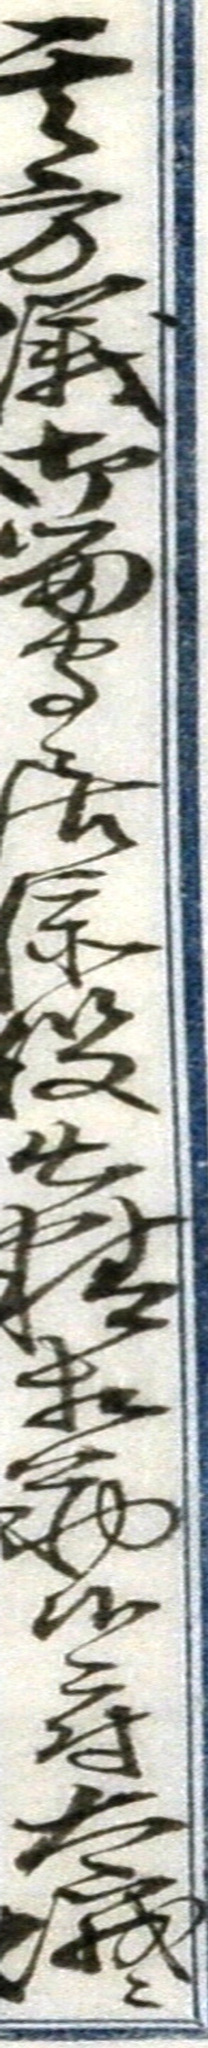其方儀御留守居添役出精相勤候ニ付太儀ニ
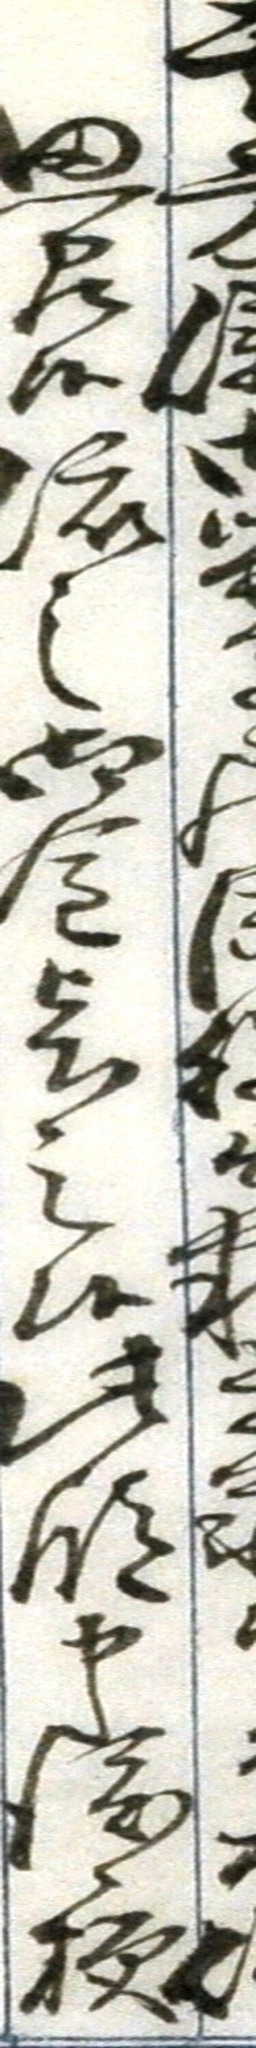思召候依之御金被下之候此段申渡候様
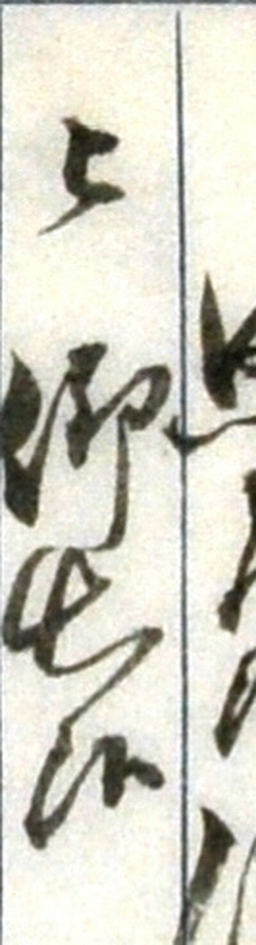被仰出候
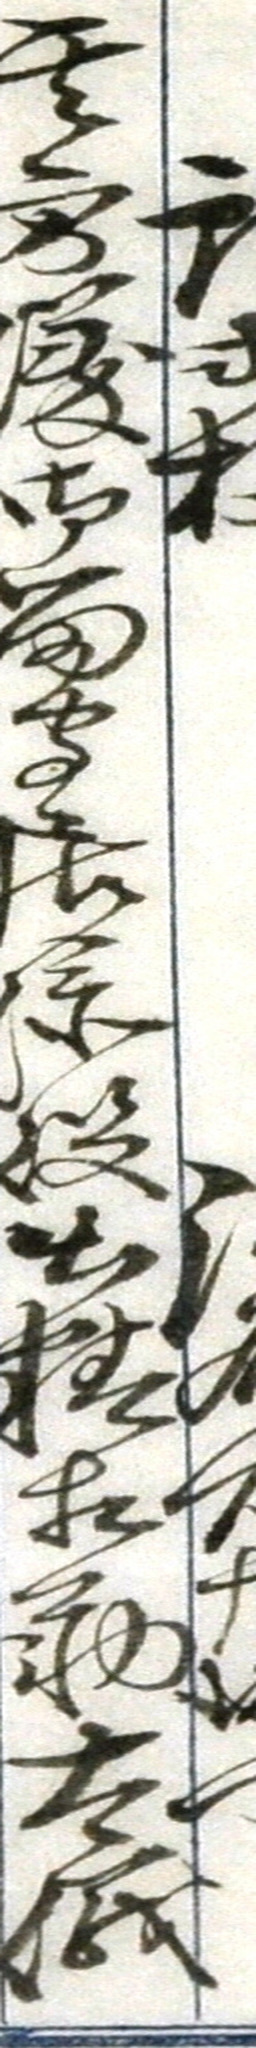其方儀御留守居添役出精相勤太儀
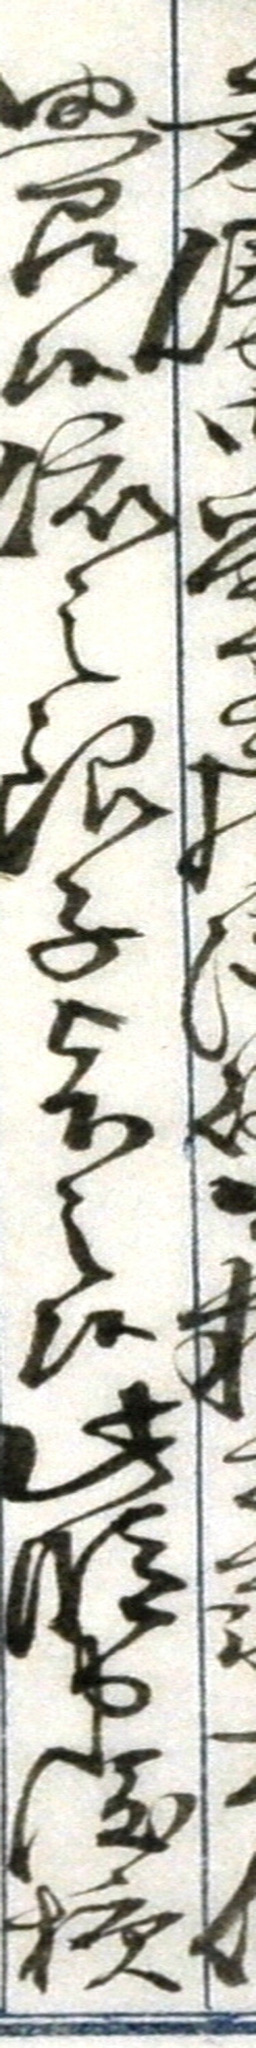思召候依之銀子被下之候此段申渡候様
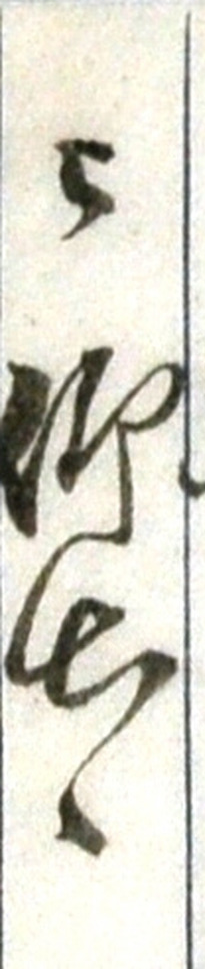被仰出候
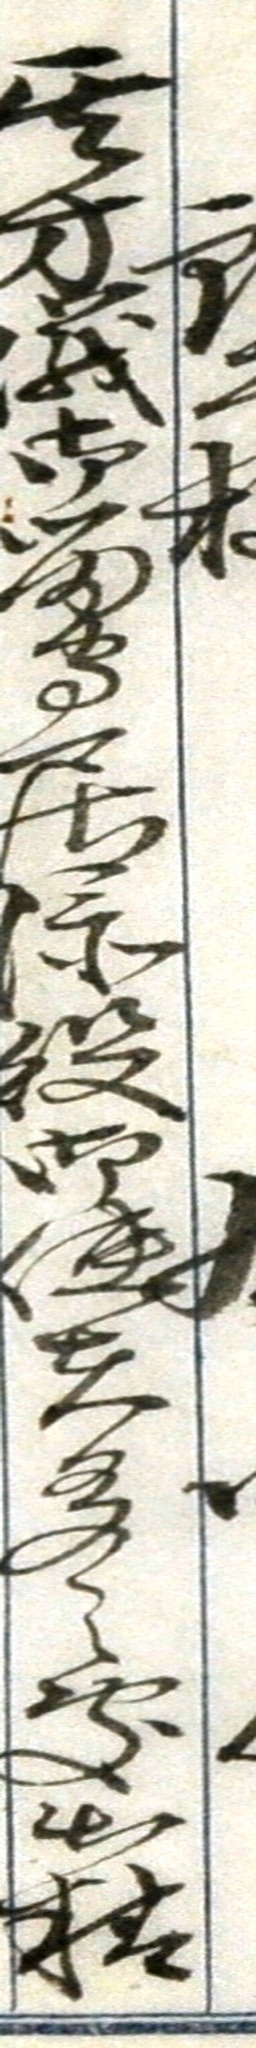其方儀御留守居添役御使者多之處出精
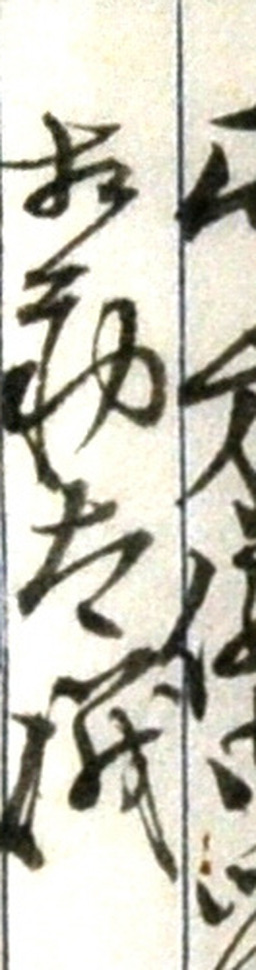相勤太儀

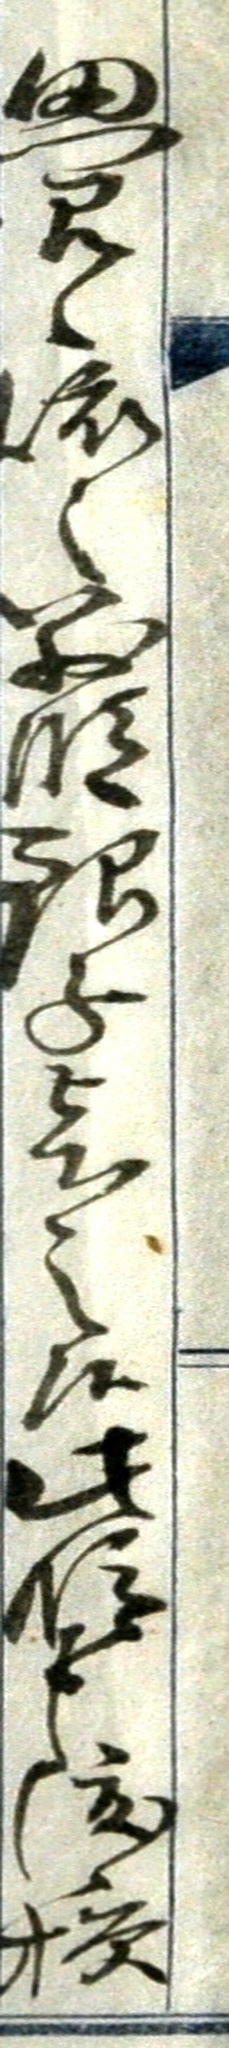思召候依之前段銀子被下之候此段申渡候様
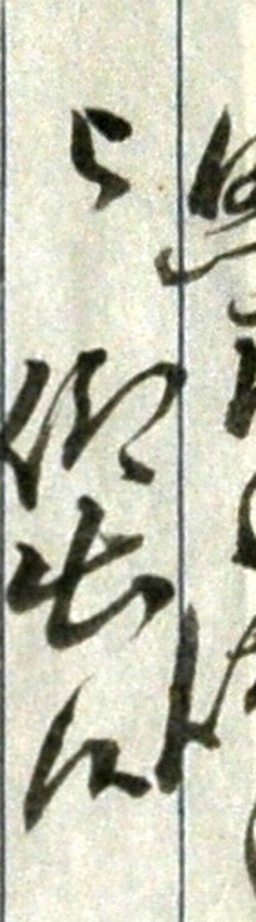被仰出候
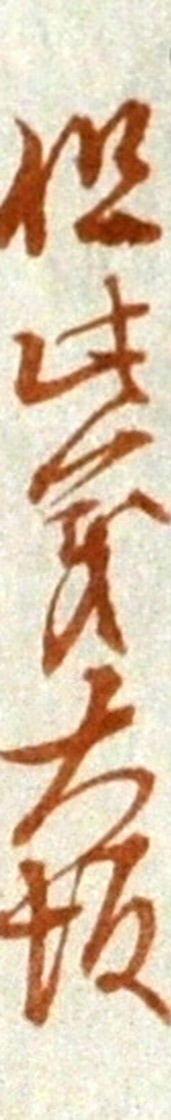但此義大坂
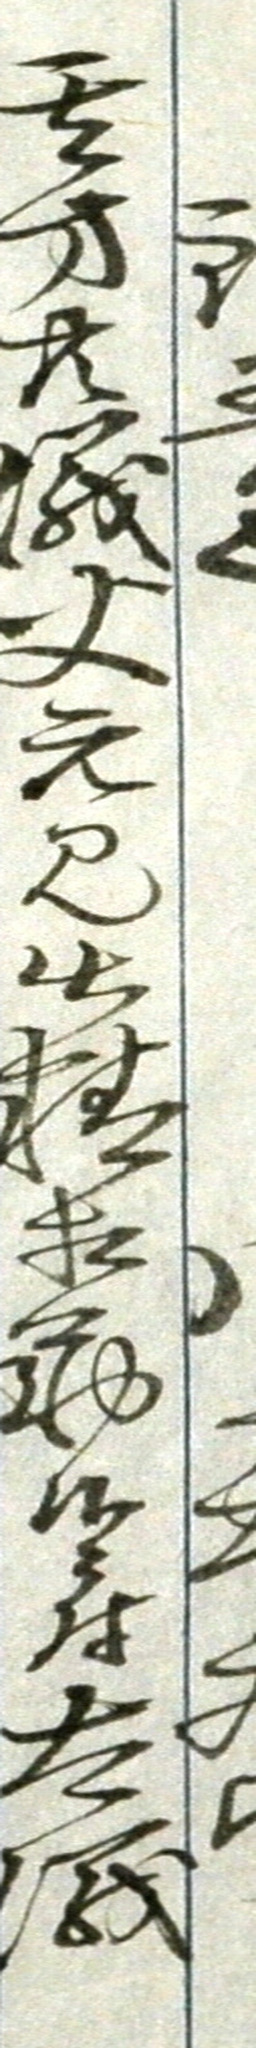其方共儀火元見出精相勤候ニ付太儀
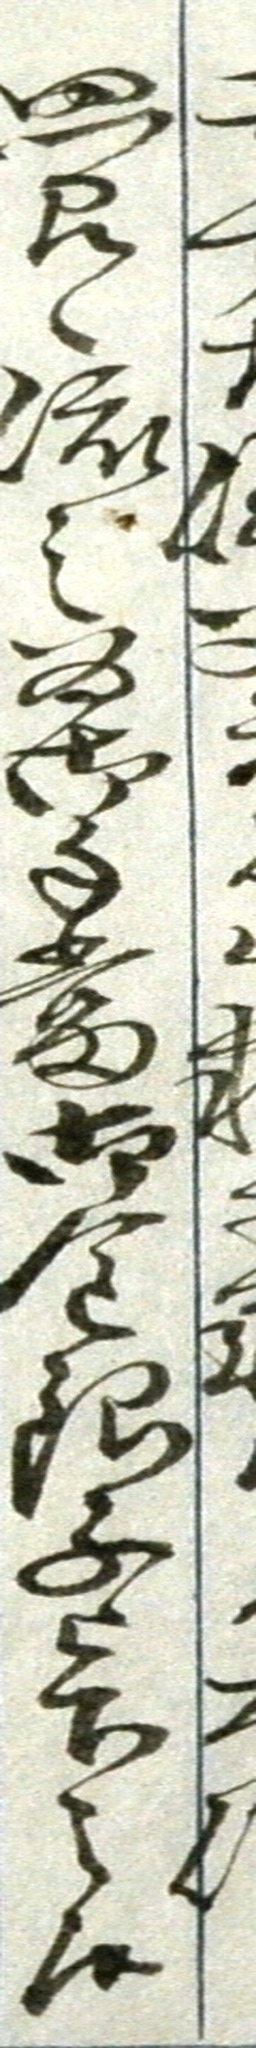思召候依之為御手当御金銀子被下之候
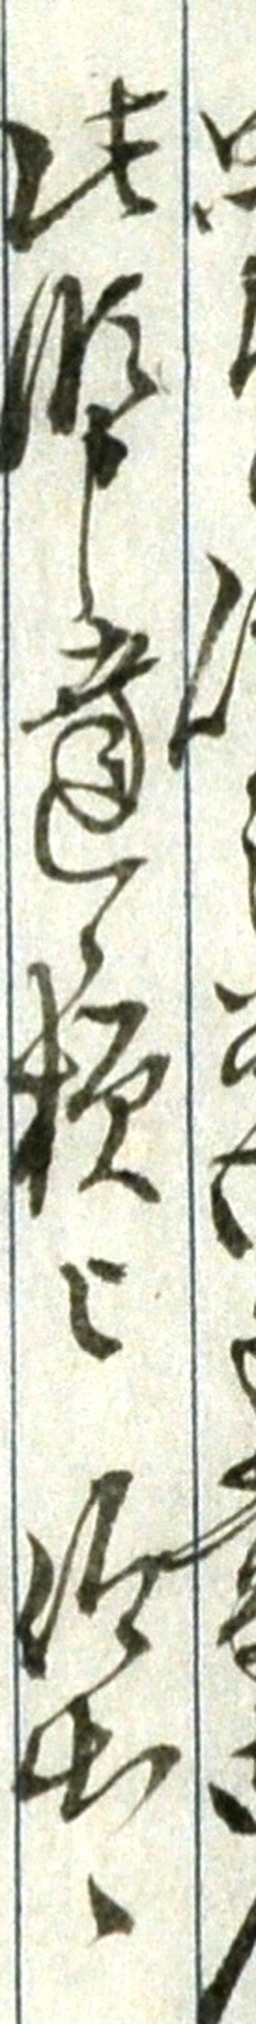此段申達候様被仰出候
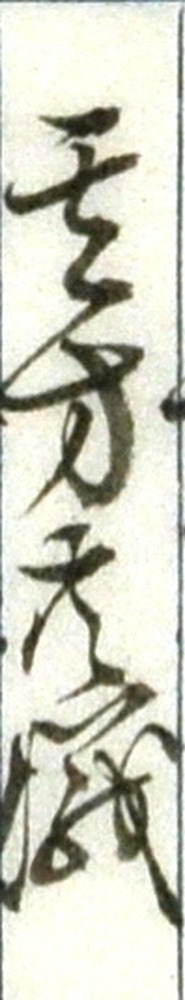其方共儀
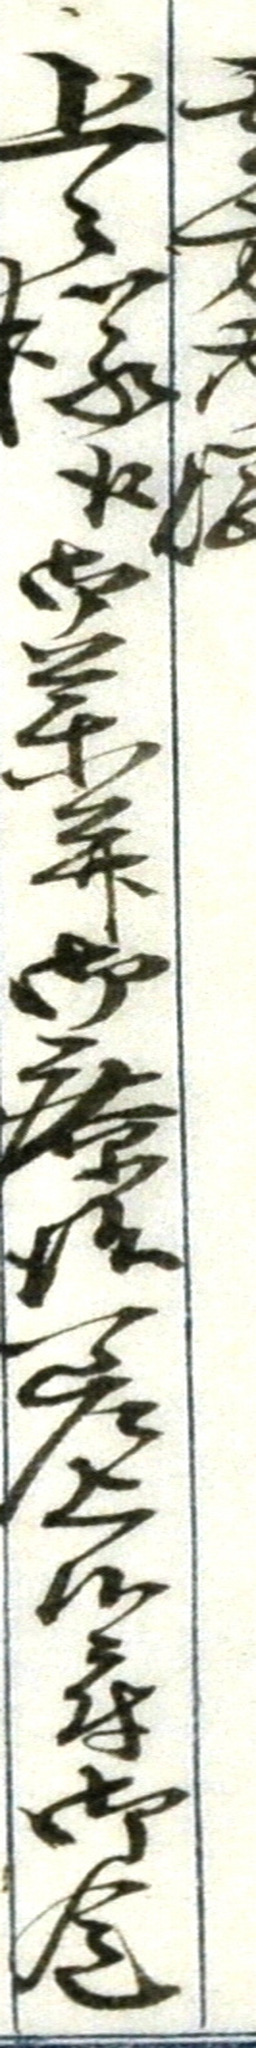上々様江御薬幷御療法差上候ニ付御金
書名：上方ヨリ御帰府之後江戸勤并江戸在番中之者江被下・控
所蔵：伊那市立高遠町図書館・合同会社AMANE
